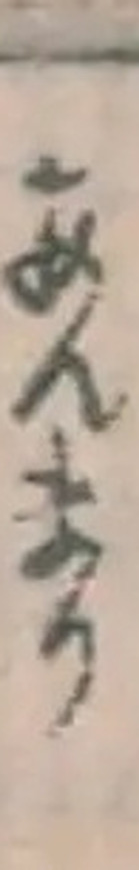あんまり
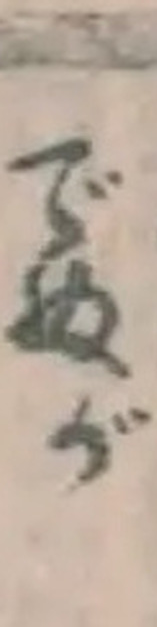でぬが
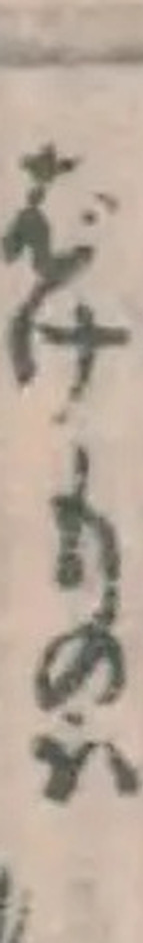ばけものは

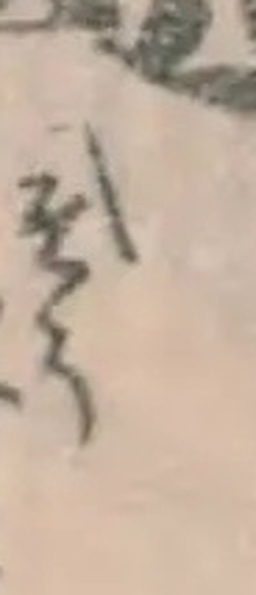〽そう
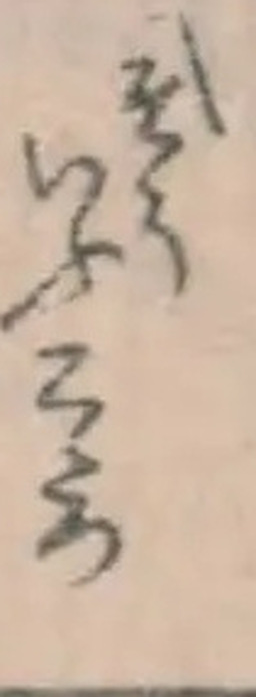いふこゝろ
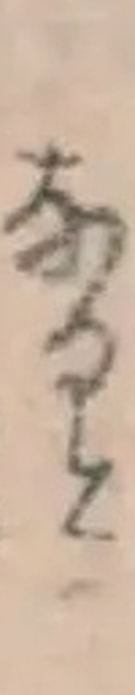なると
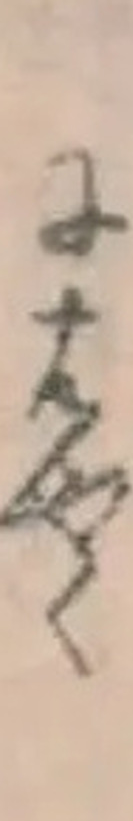にはやく
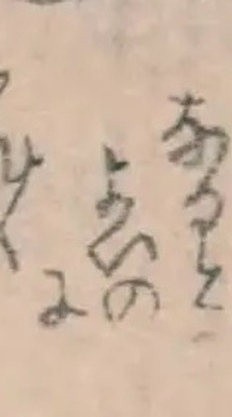よいの
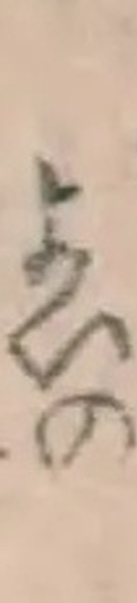よいの
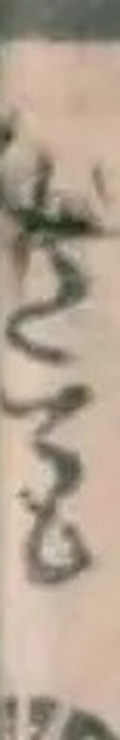さても
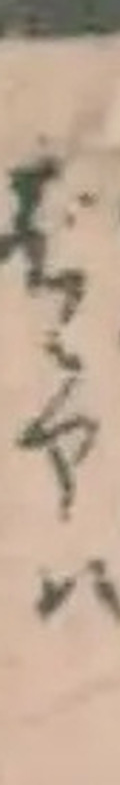ばゝあは
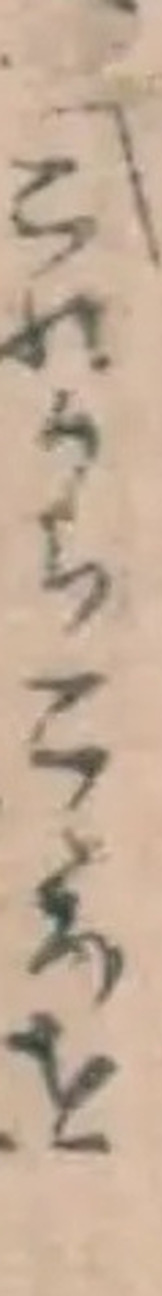〽これからこゝろを
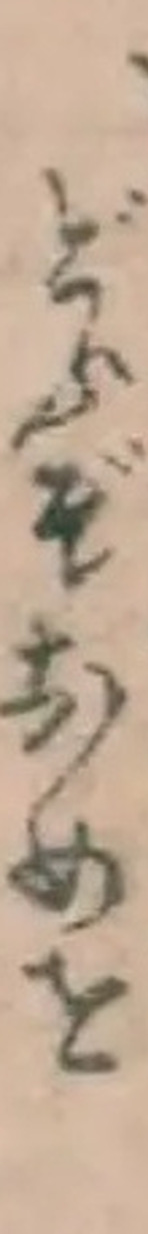どふぞおめを
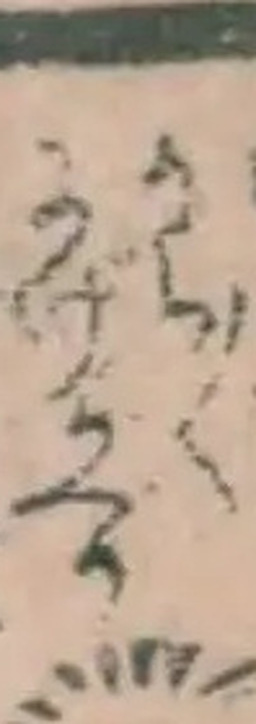にげかへり
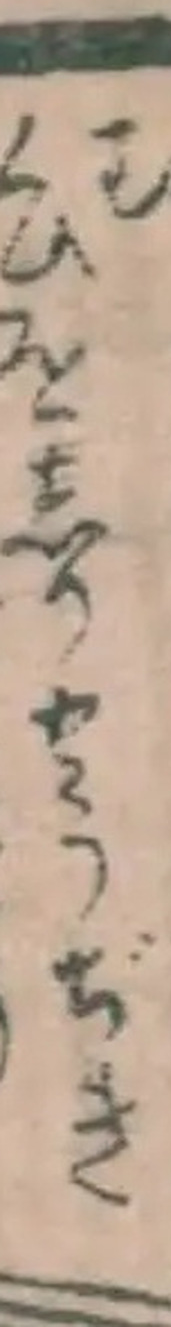くひをしりせうぢき
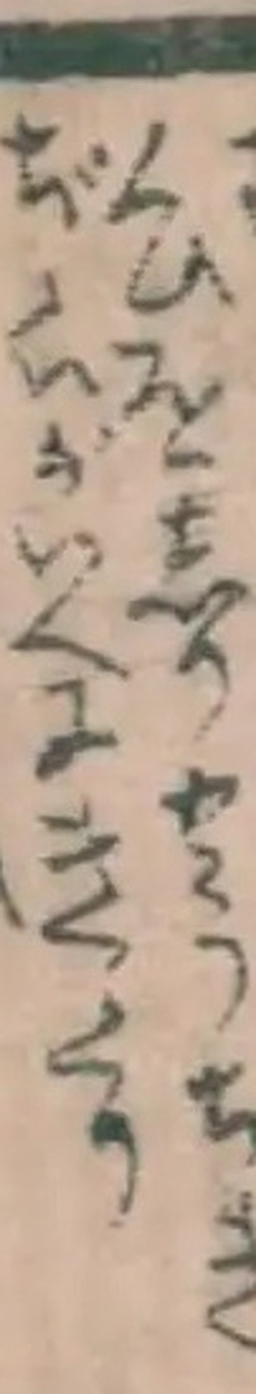ぢゝいがいへにきたり
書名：舌切雀
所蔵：国立国会図書館 National Diet Library, JAPAN
